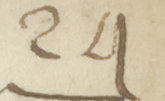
24
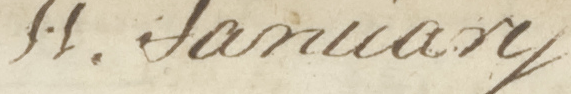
11. January.
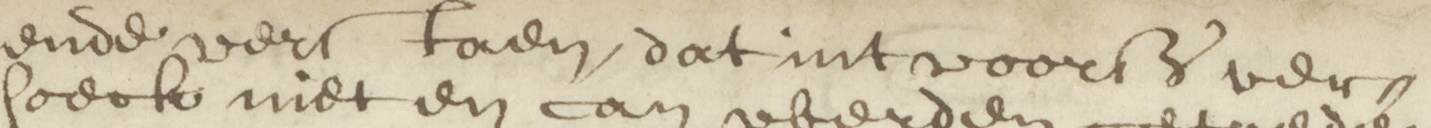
ende verstaen, dat int voors ver„
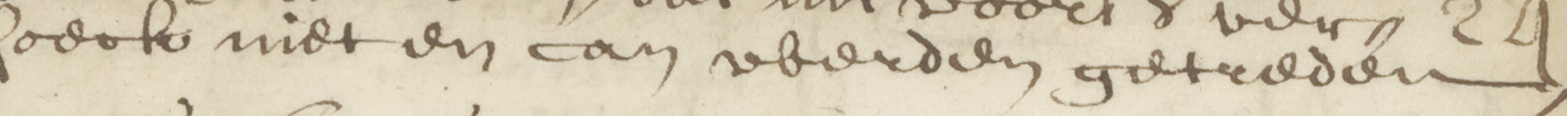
soeck niet en can werden getreden.
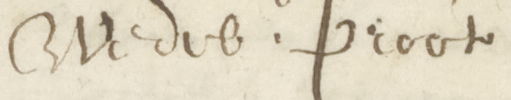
Wedwe. Proot
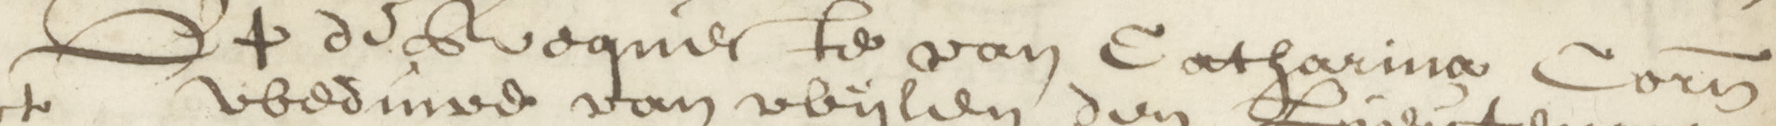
Op de Requeste van Catharina Corn
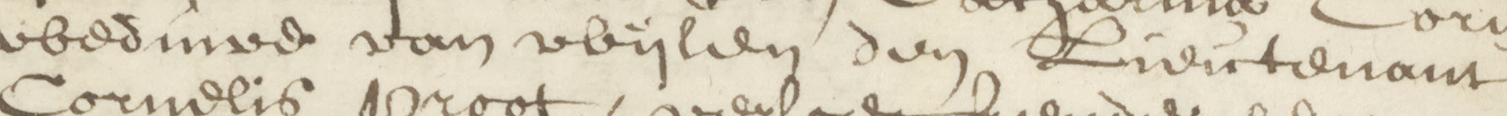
weduwe van wijlen den Lieutenant
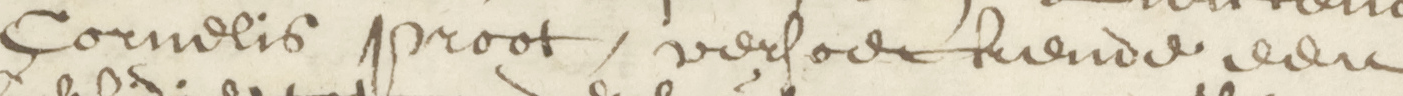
Cornelis Proot, versoeckende een
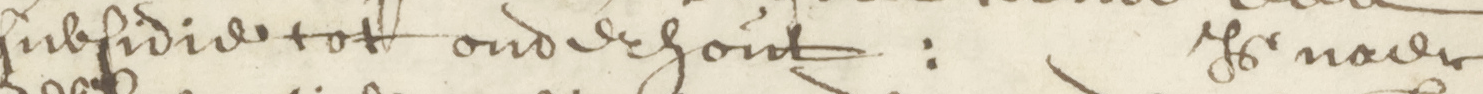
subsidie tot onderhout: Is naer
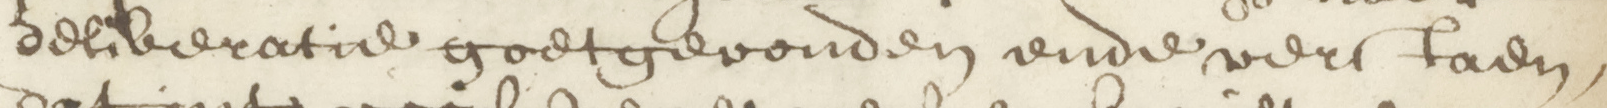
deliberatie goetgevonden ende verstaen,
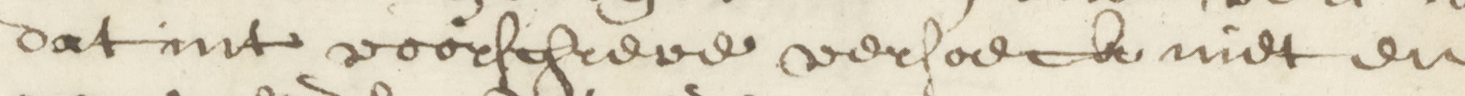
dat int voorschreve versoeck niet en
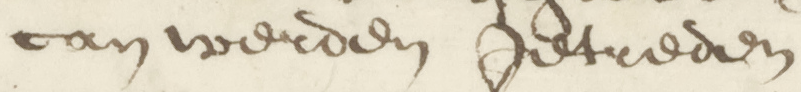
can werden getreden.
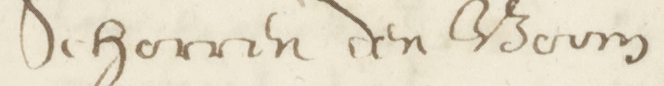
Schorren den Boom
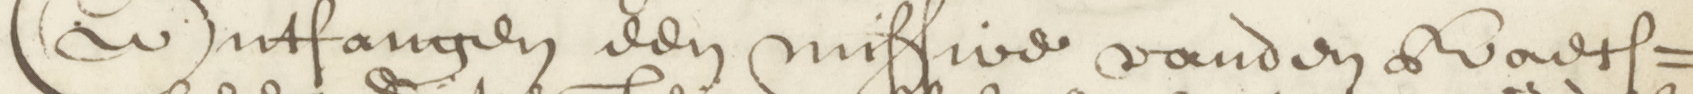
Ontfangen een missive vanden Raets„
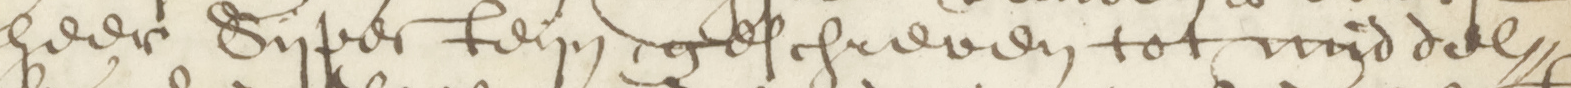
heer Sijpesteijn, geschreven tot middel„
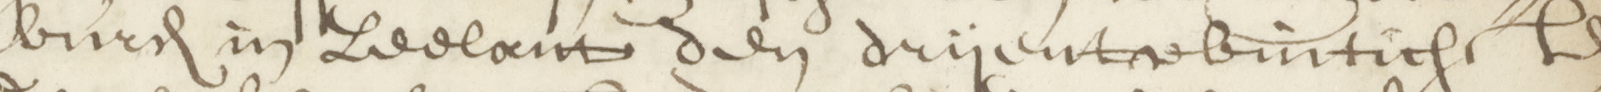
burch in Zeelant den drijentwintichsten
